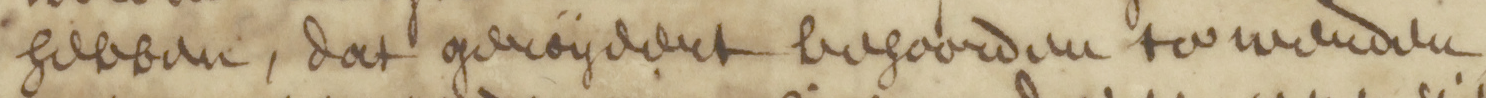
hebben, dat geroijeert behoorden te werden
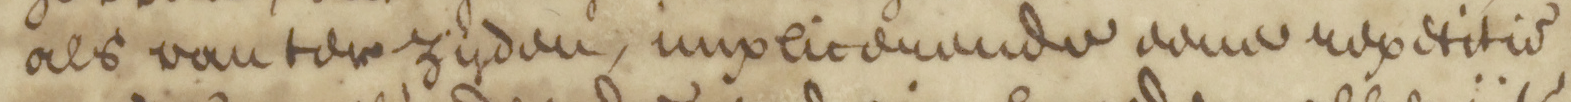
als van ter zijden, implicerende eene repetitie
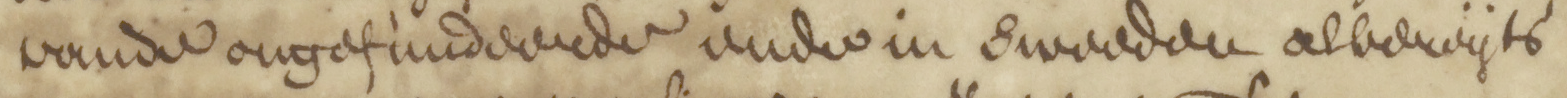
vande ongefundeerde, ende in Sweeden albereijts
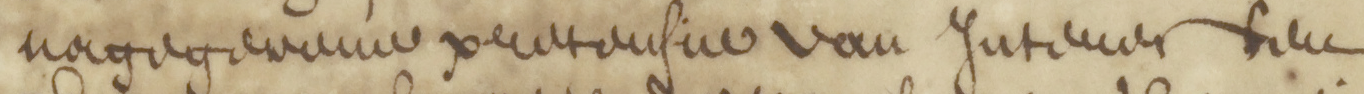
nagegevene pretensie van Interesten
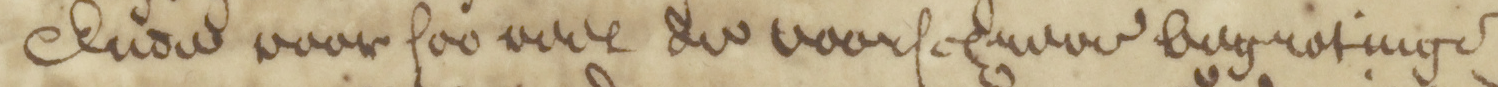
Ende voor soo veel de voorschreve begrotinge
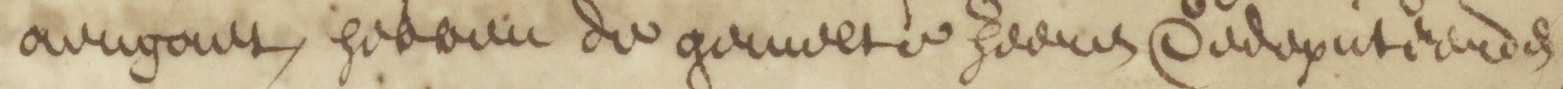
aengaet, hebben de gemelte heeren Gedeputeerden
